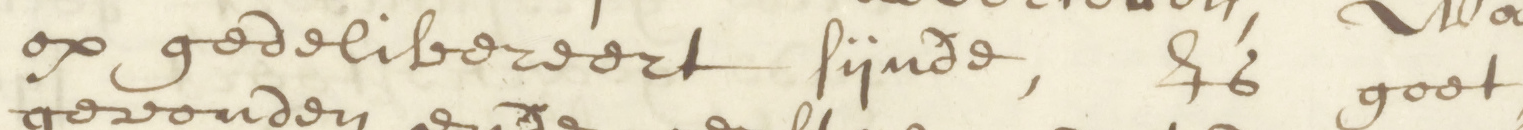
op gedelibereert sijnde, Is goet„
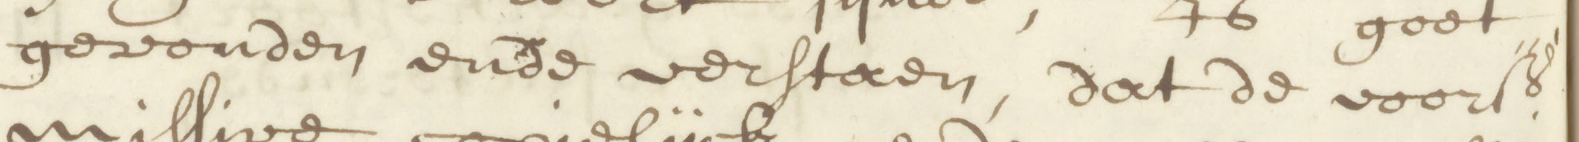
gevonden ende verstaen, dat de voors.
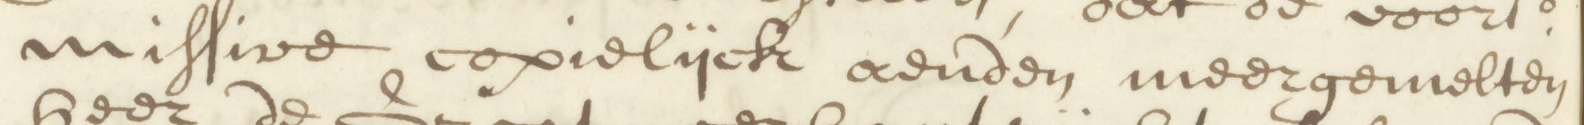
missive copielijck aenden meergemelten
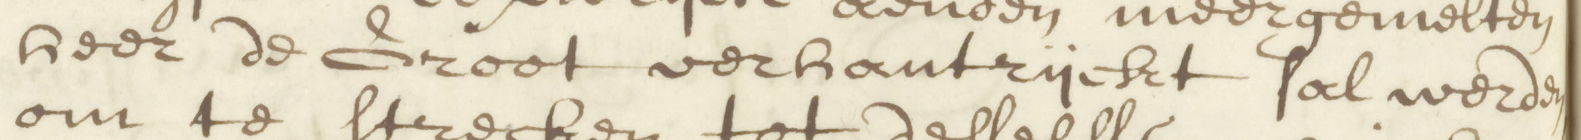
heer de Groot verhantrijckt sal werden,
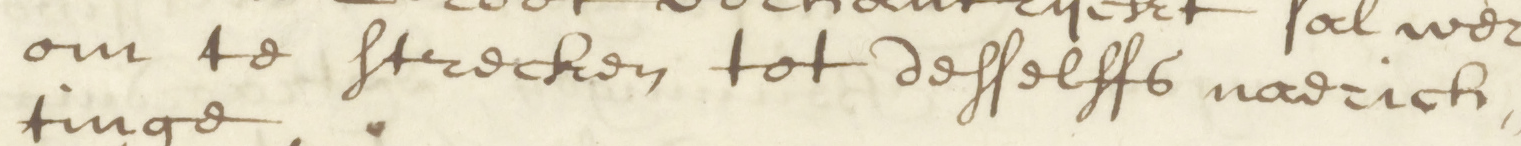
om te strecken tot desselffs naerich„
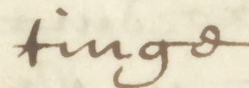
tinge.
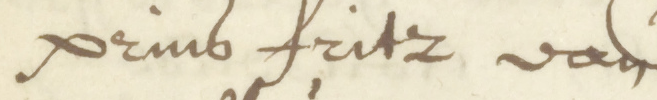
prins Fritz van
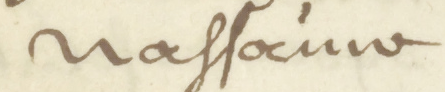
nassauw
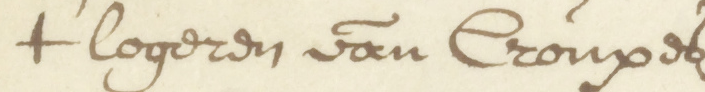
t' logeren van Troupes
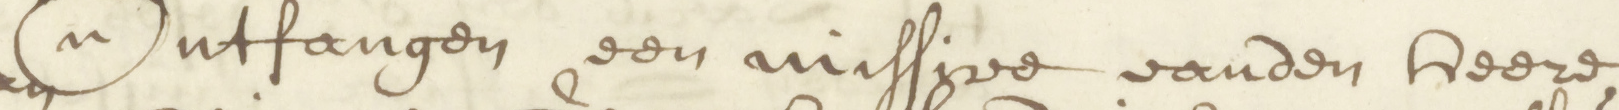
Ontfangen een missive vanden heere
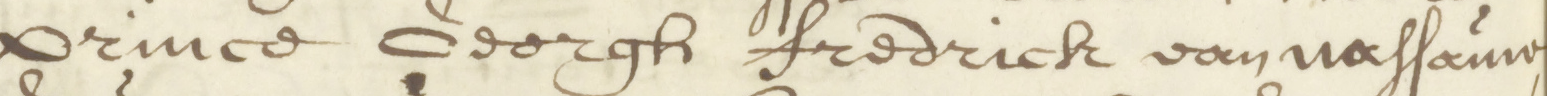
Prince Georgh Fredrick van nassauw,
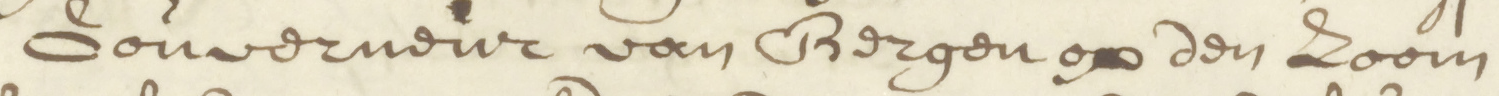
Gouverneur van Bergen op den Zoom,
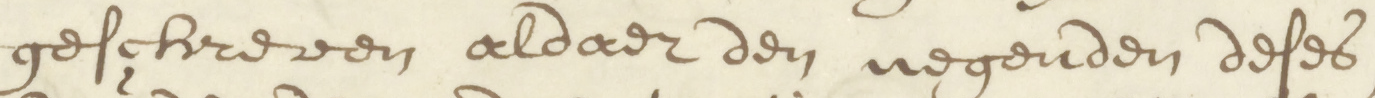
geschreven aldaer den negenden deses,
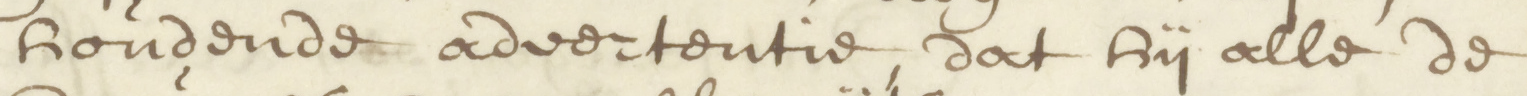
houdende advertentie, dat hij alle de
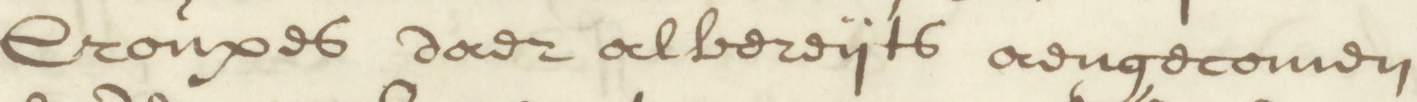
Troupes, daer albereijts aengecomen,
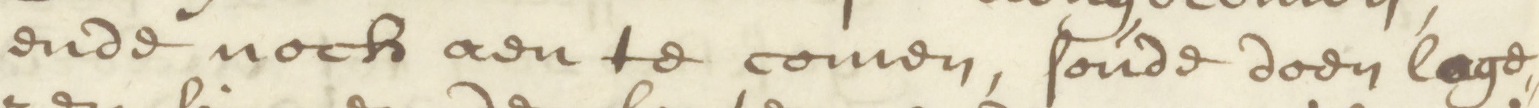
ende noch aen te comen, soude doen loge„
